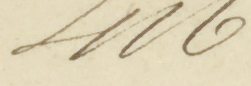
416
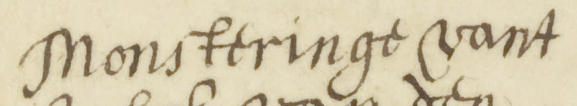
monsteringe vant
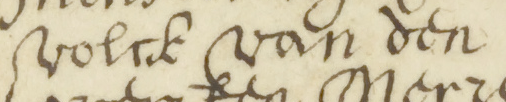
volck van den
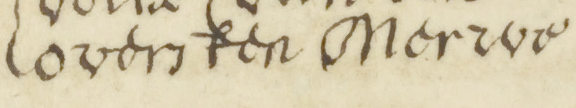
oversten Merwe
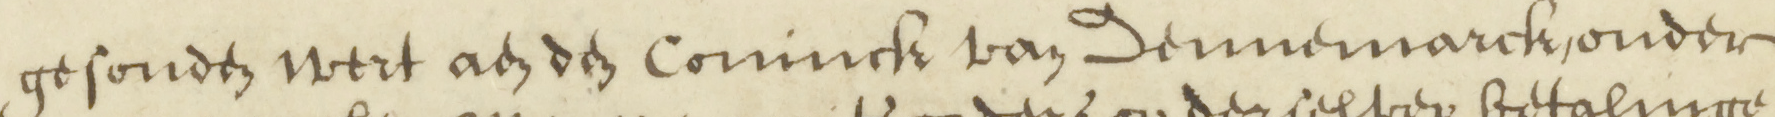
gesonden wert aen den Coninck van Dennemarck, onder
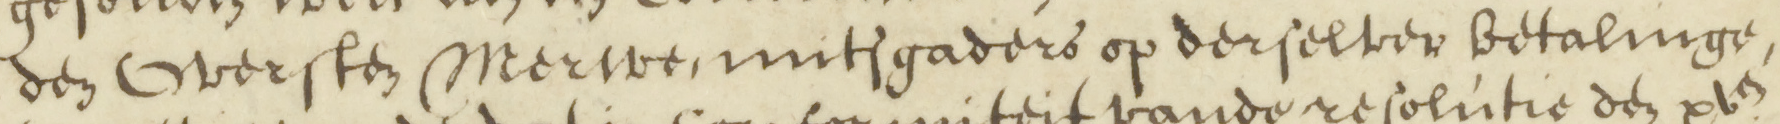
den Oversten Merwe, mitsgaders op derselver betalinge,
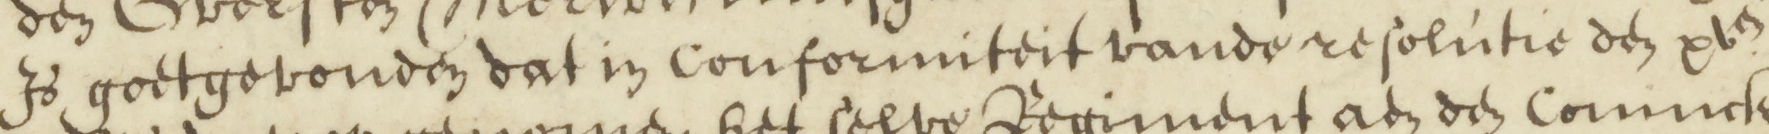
Is goetgevonden dat in conformiteit vande resolutie den xven.
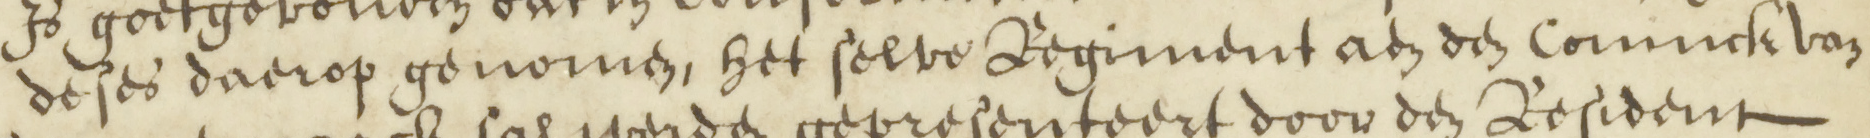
deses daerop genomen, het selve Regiment aen den Coninck van
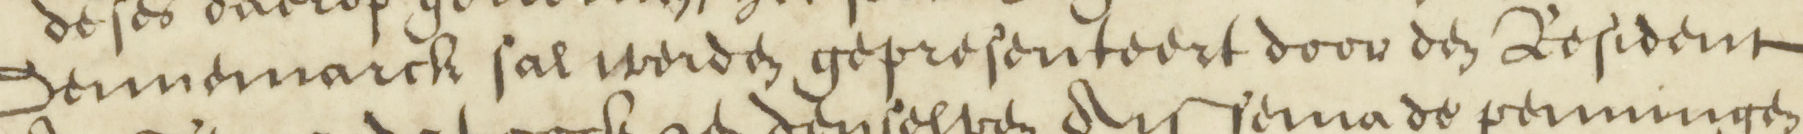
Dennemarck sal werden gepresenteert door den Resident
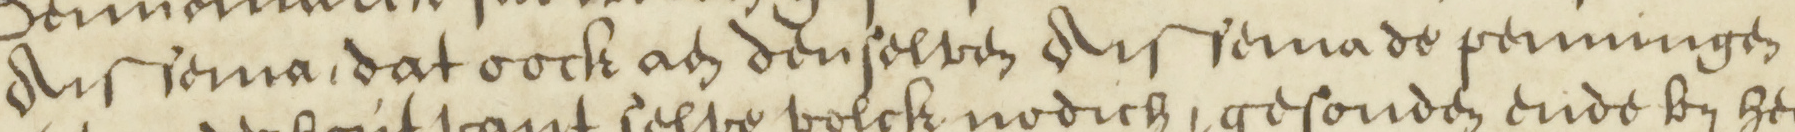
Aissema, dat oock aen denselven Aissema de penningen
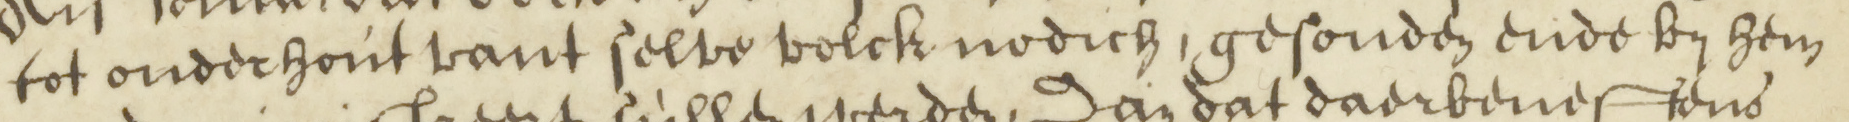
tot onderhout vant selve volck nodich, gesonden ende bij hem
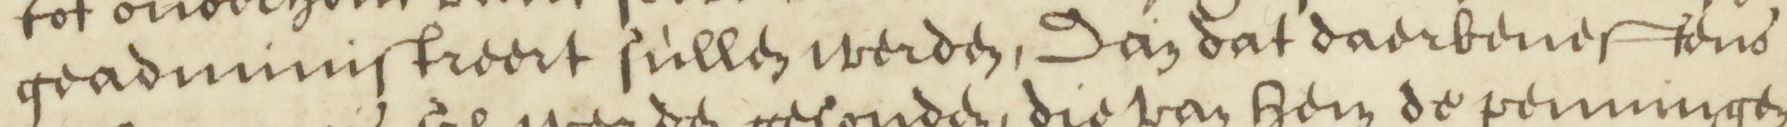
geadministreert sullen werden, Dan dat daerbeneffens
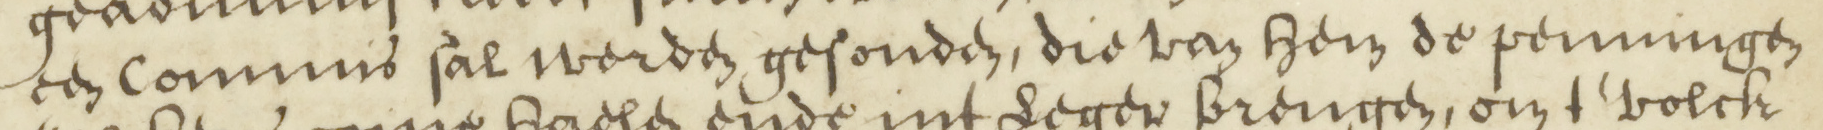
een Commis sal werden gesonden, die van hem de penningen
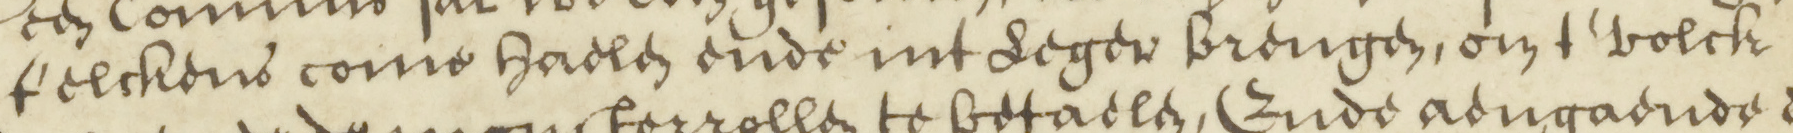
t'elckens come haelen ende int Leger brengen, om t‛volck
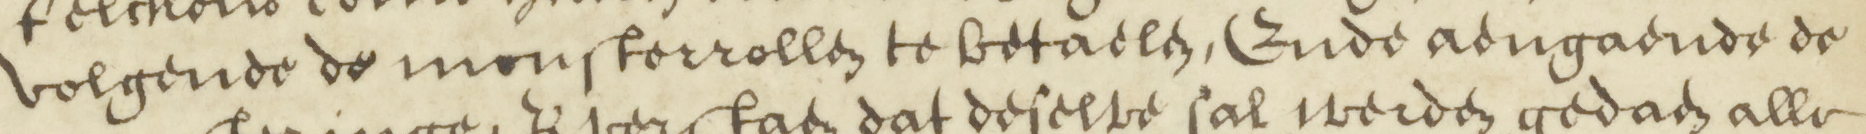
volgende de monsterrollen te betaelen. Ende aengaende de
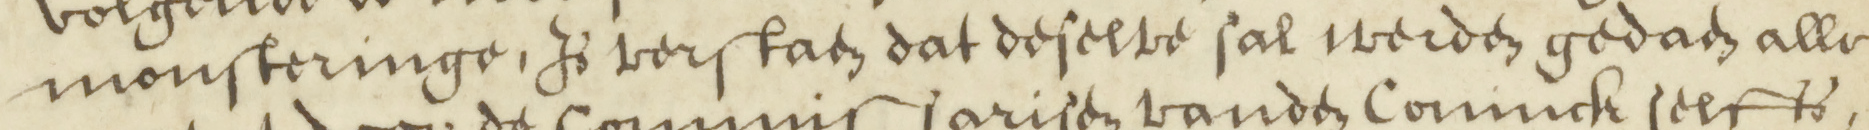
monsteringe, Is verstaen dat deselve sal werden gedaen alle
